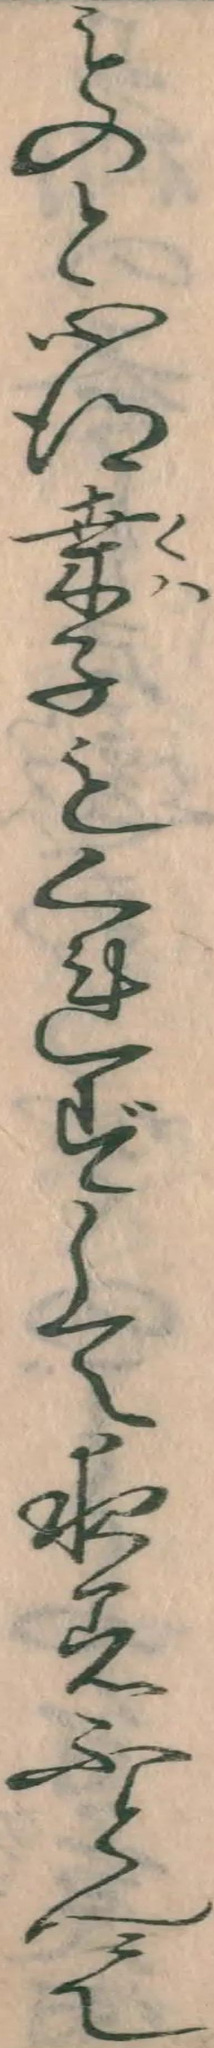ものと心得桑子もくれずして夜着ふとんにて
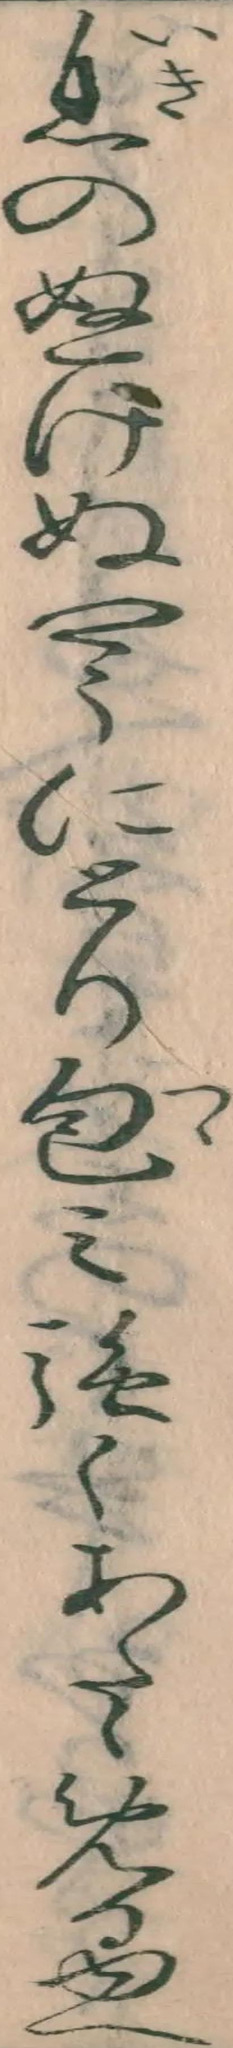息のぬけぬやうにとり包み強くあたゝめるゆへ
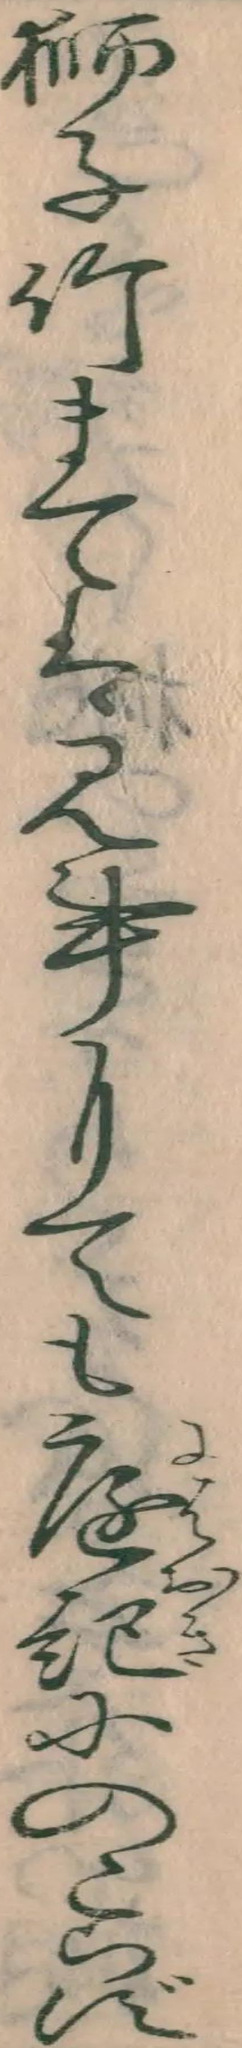獅子竹まては見事にても庭起にのこらず
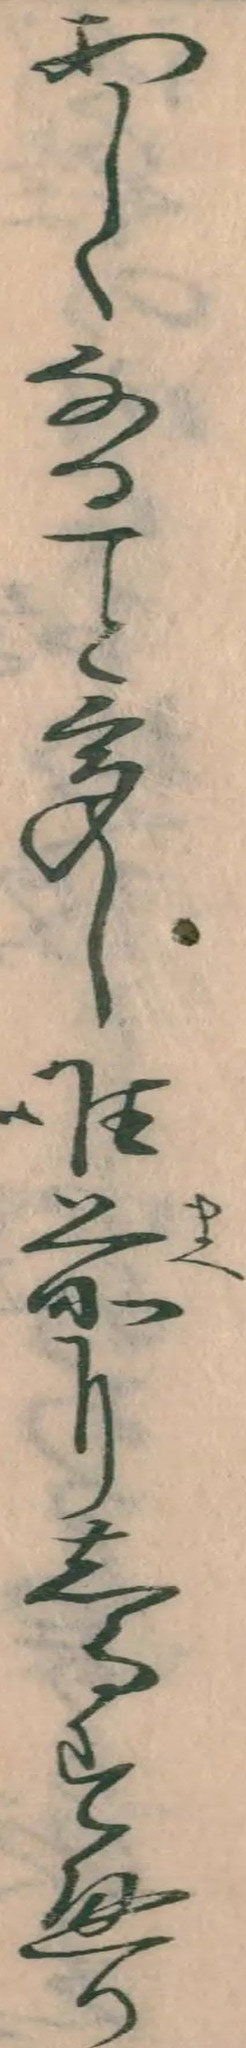あしくなること多し唯前にしるす通り
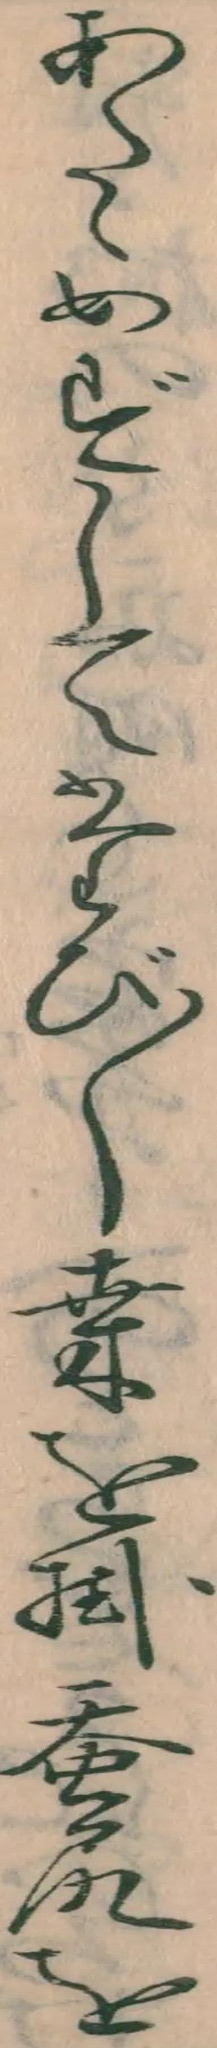あたゝめずしてたび〳〵桑を掛蚕尻を
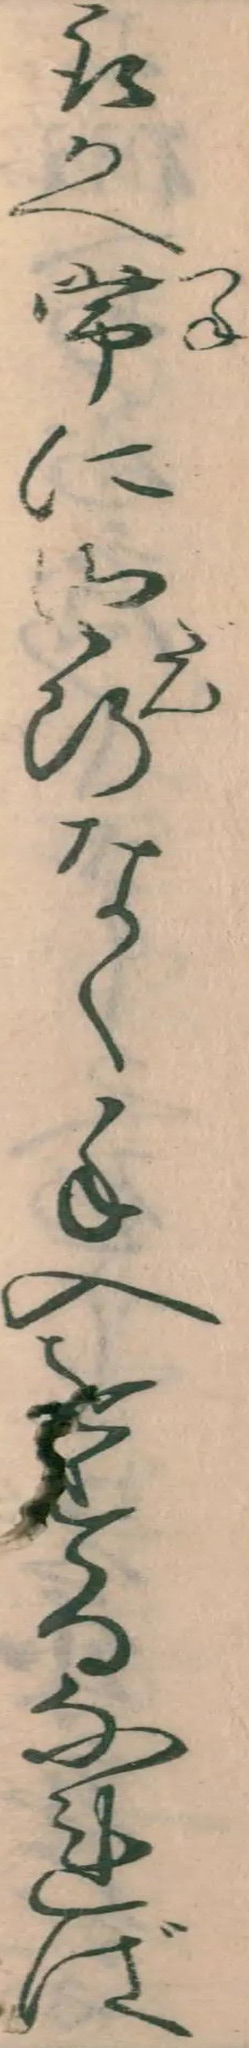取かへ常に断なく手入をするなれば
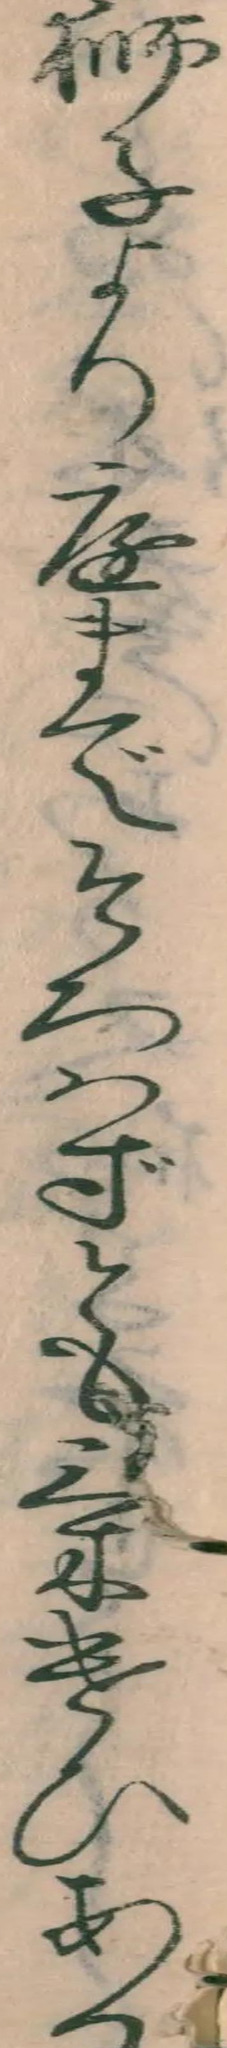獅子より庭までそろはずとも気遣ひある
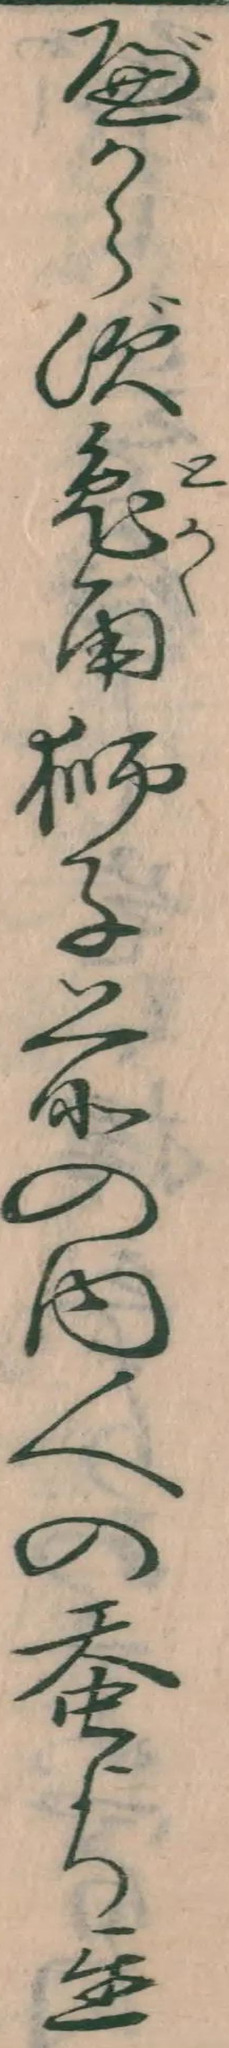べからず兎角獅子前の内人の蚕より遅
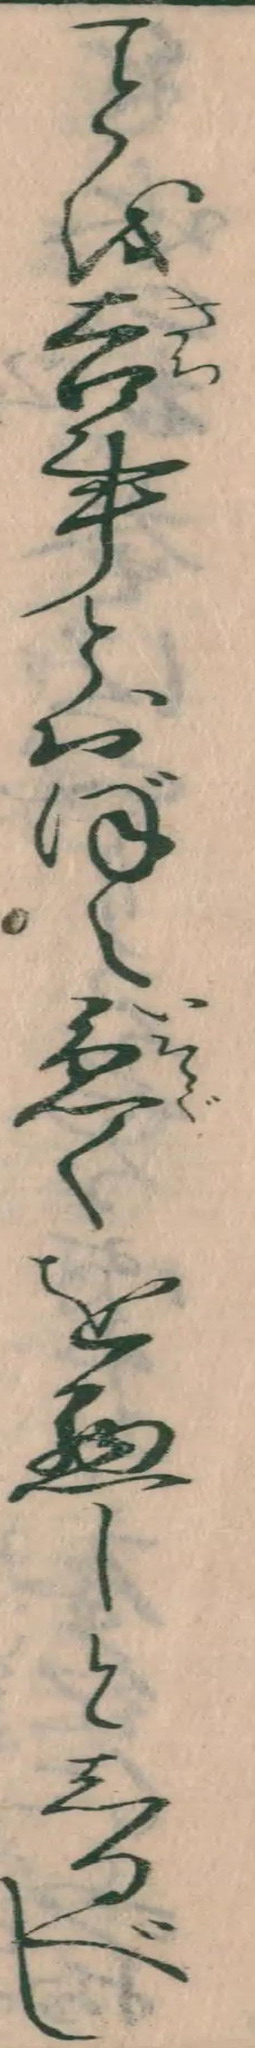ことを吉事とおぼえ急くを悪しとしるべし
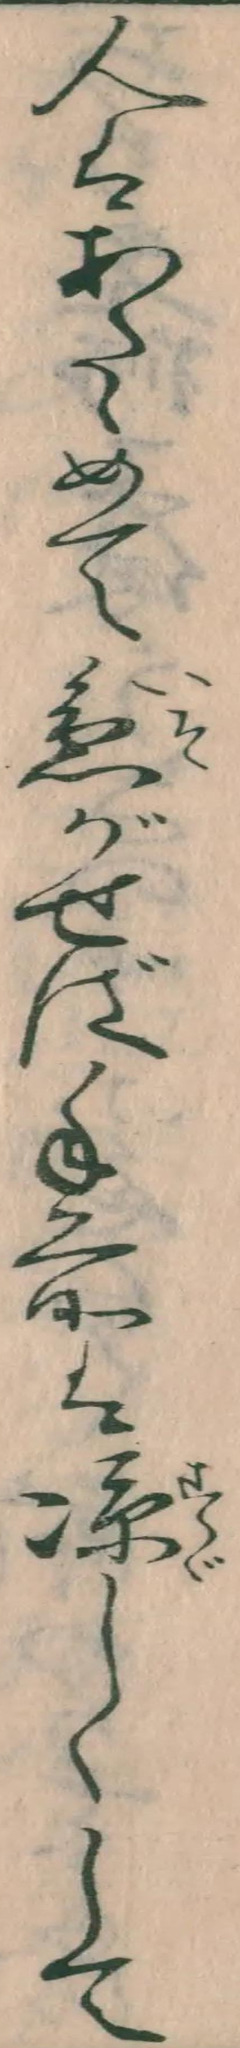人はあたゝめて急がせば手前は涼しくして
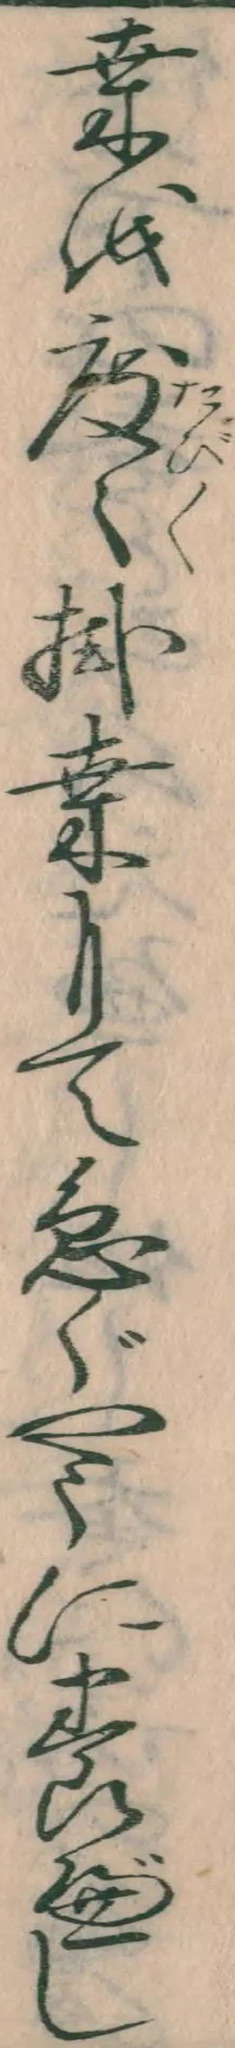桑を度々掛桑にて急ぐやうに養べし
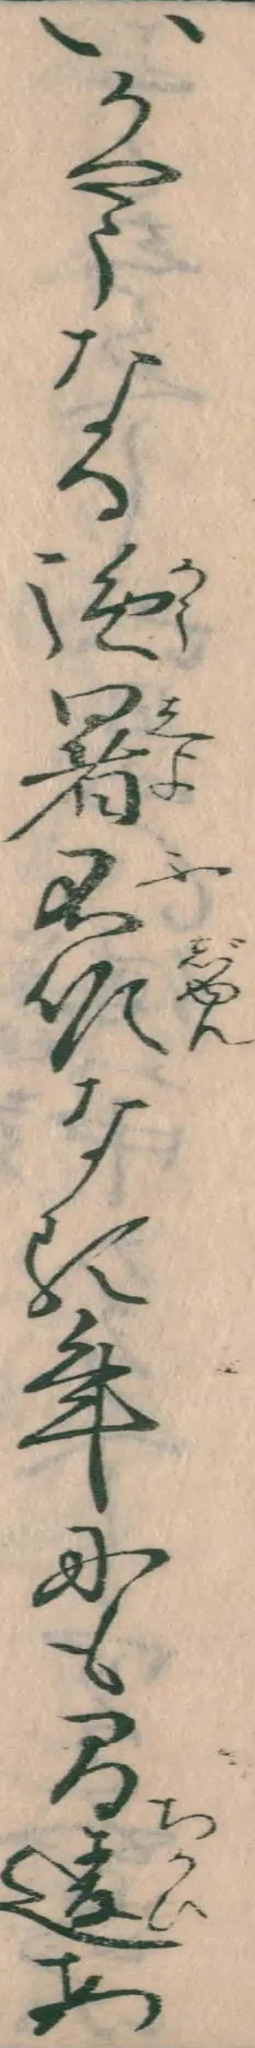いかやうなる強暑不順なる年にも間違あ
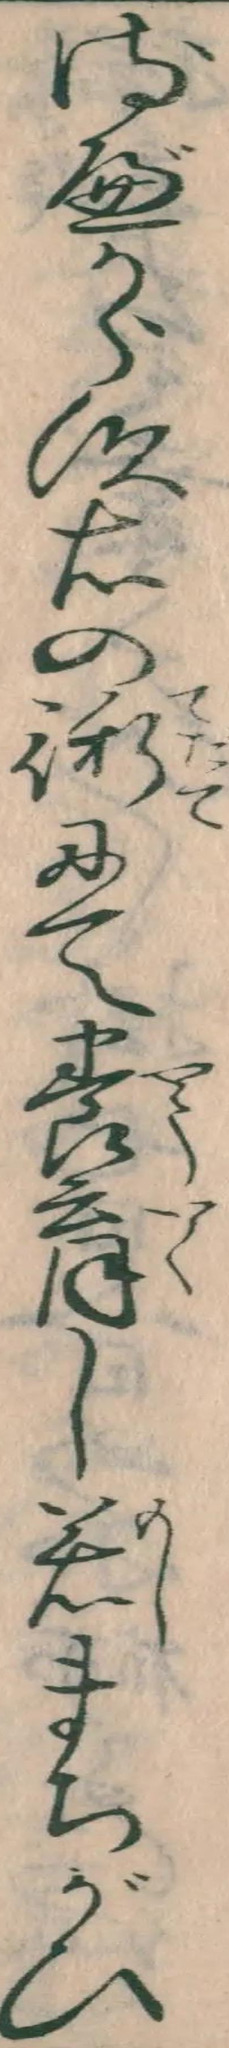るべからす右の術にて養育し若まちがひ
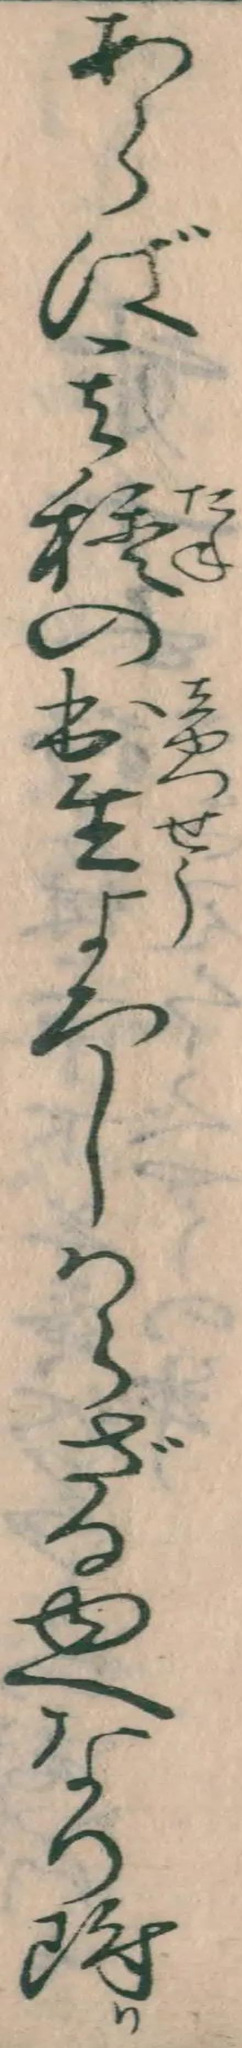あらば其種の出生よろしからざるゆへなり附り
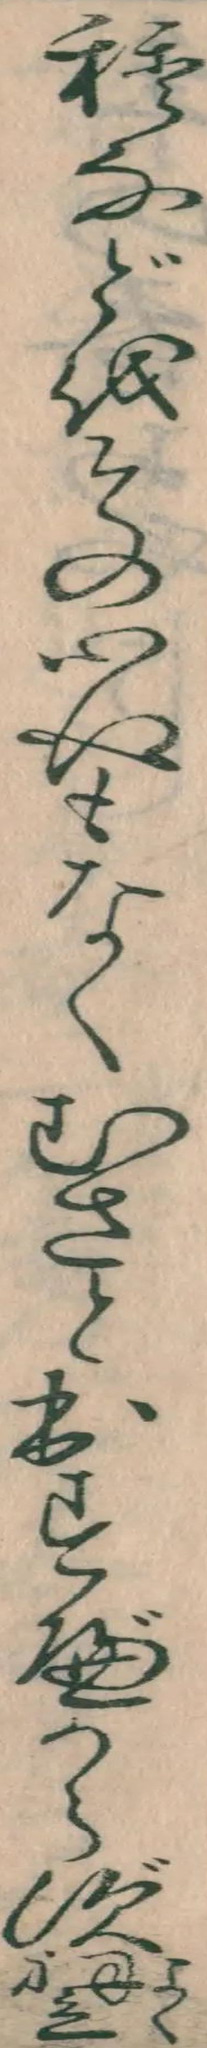種などをその心得もなくむさと出すべからず翌

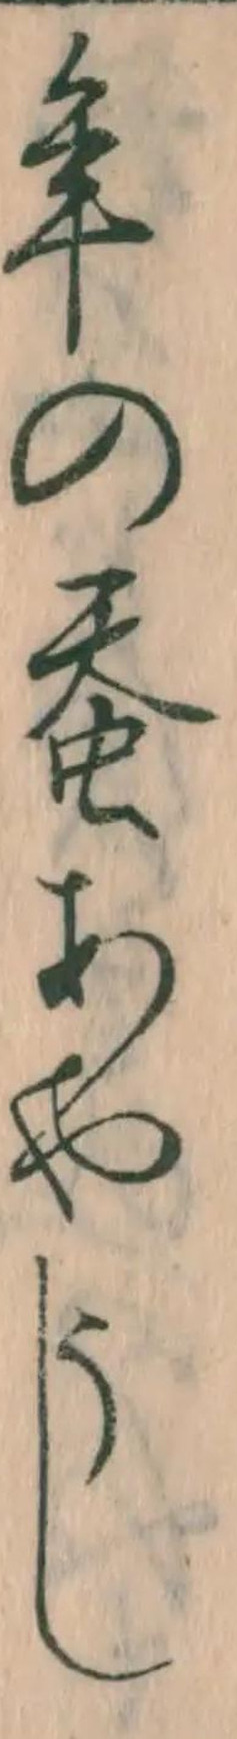年の蚕あやうし
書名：新撰養蚕秘書
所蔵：国立国会図書館 National Diet Library, JAPAN
